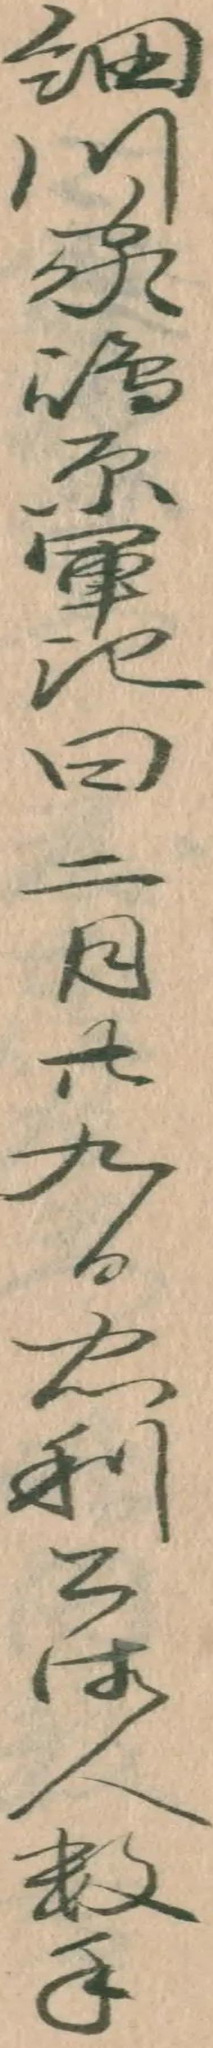細川家島原軍記曰二月廿九日忠利公御人数手
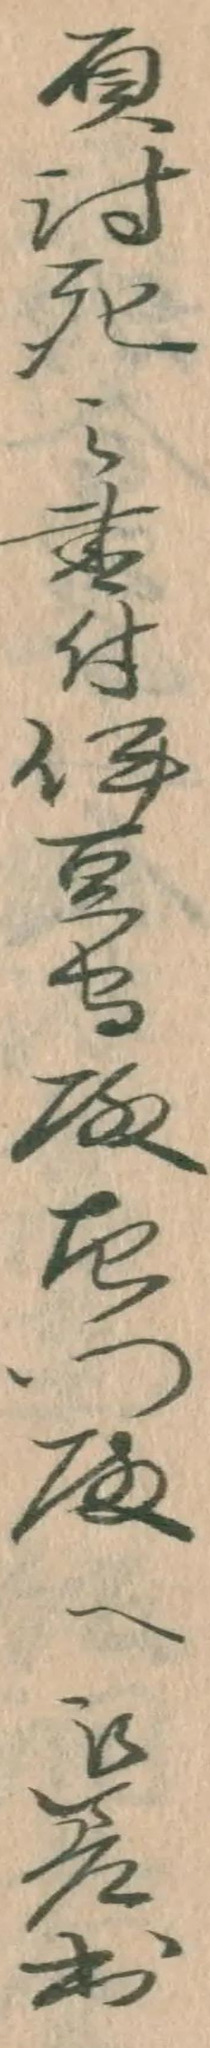負討死之書付伊豆守殿左門殿へ被差出
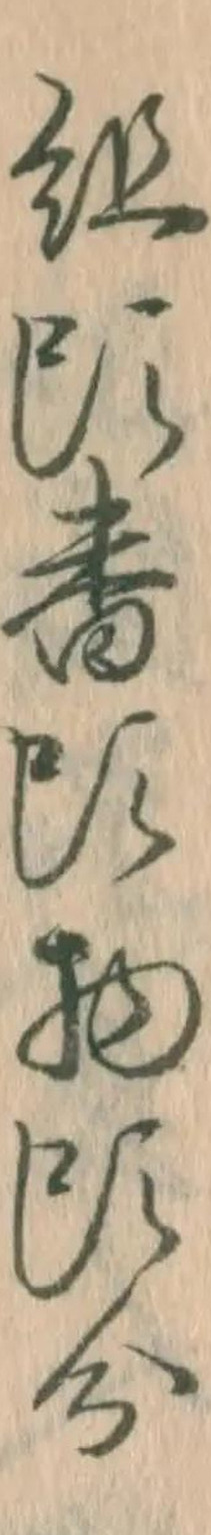組頭番頭物頭分
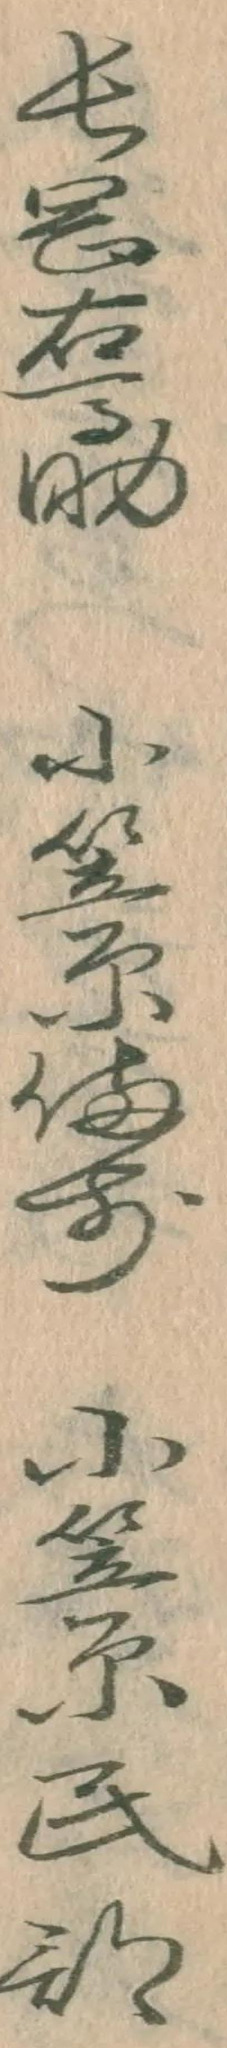長岡右馬助小笠原備前小笠原民部
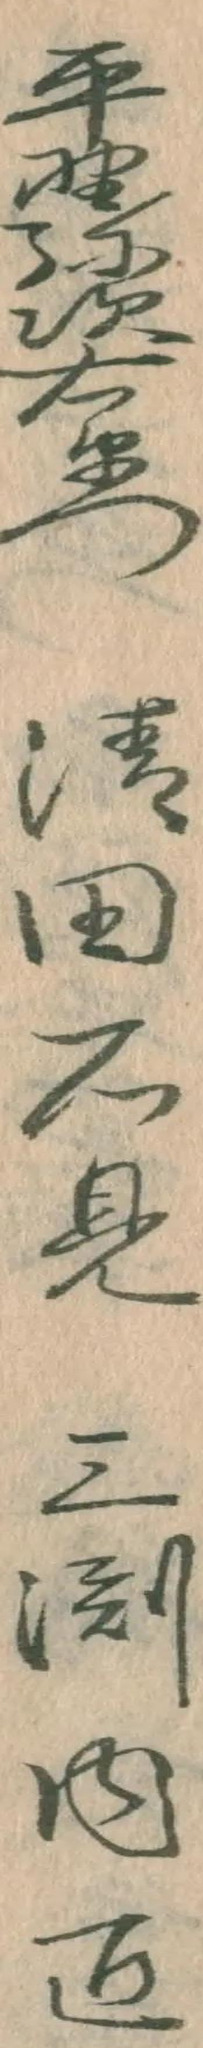平野弥次右衛門清田石見三渕内匠
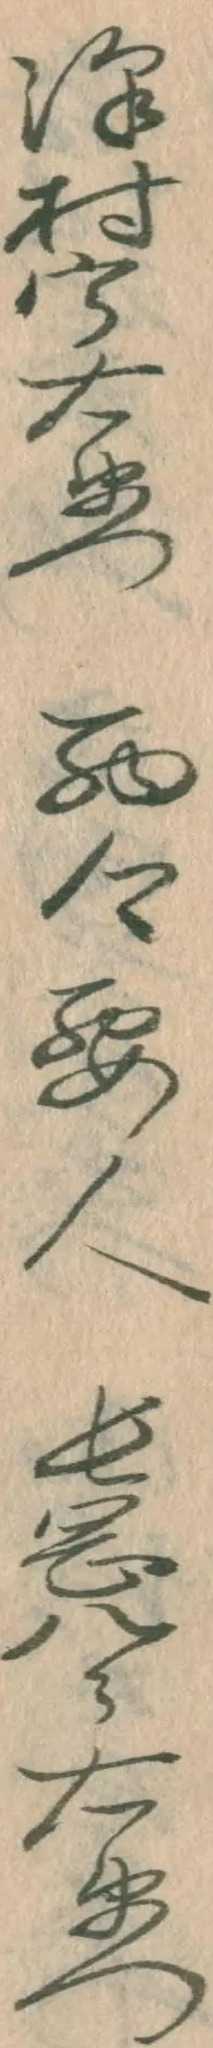沢村宇右衛門西郷要人長岡八郎右衛門
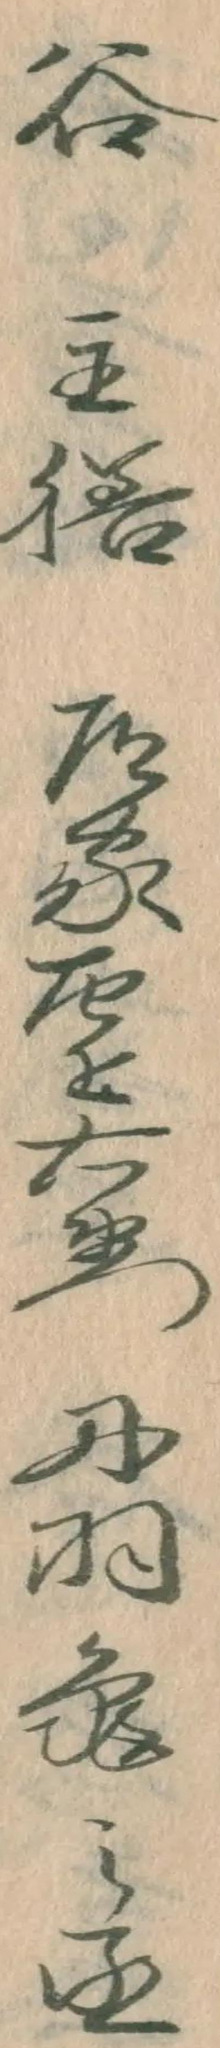谷主膳道家左近右衛門丹羽亀之丞
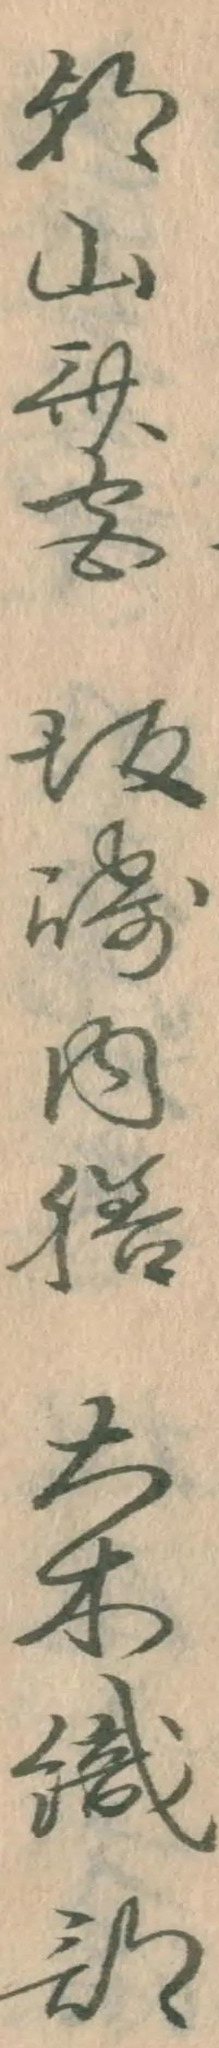朝山斎宮坂崎内膳大木織部
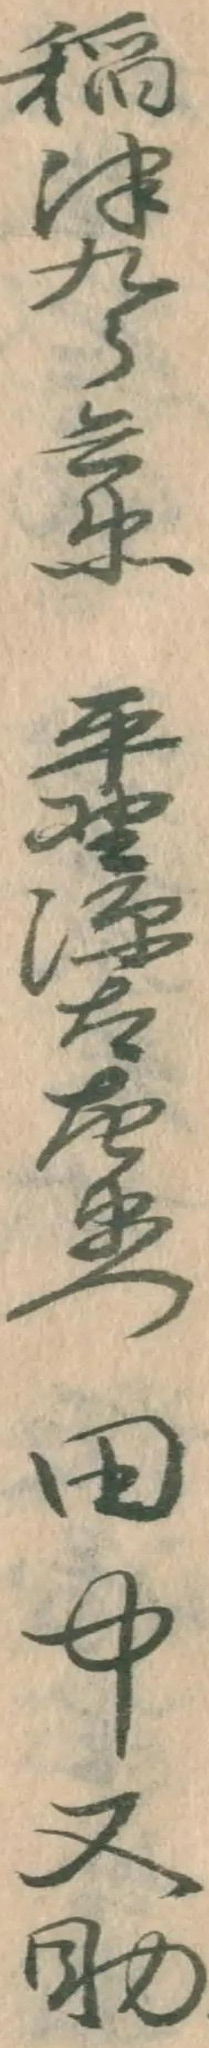稲津九郎兵衛平野源太左衛門田中又助

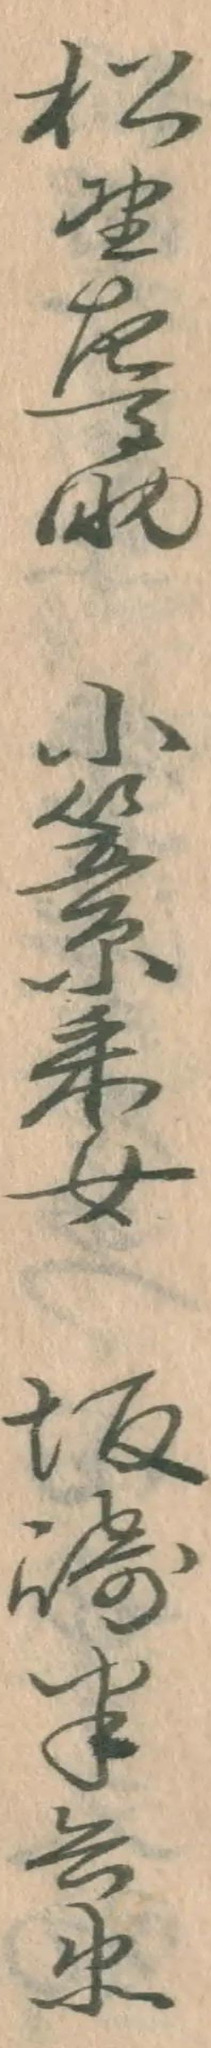松野左馬助小笠原采女坂崎半兵衛
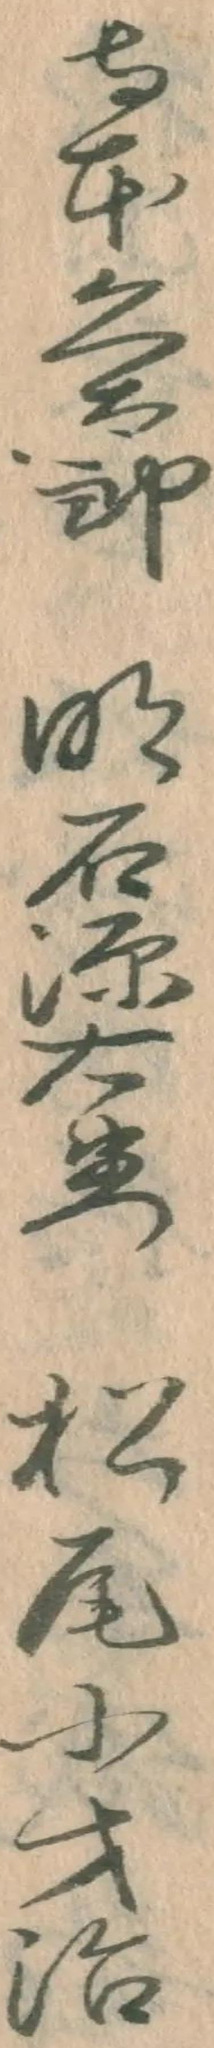寺本久太郎明石源右衛門松尾小才治
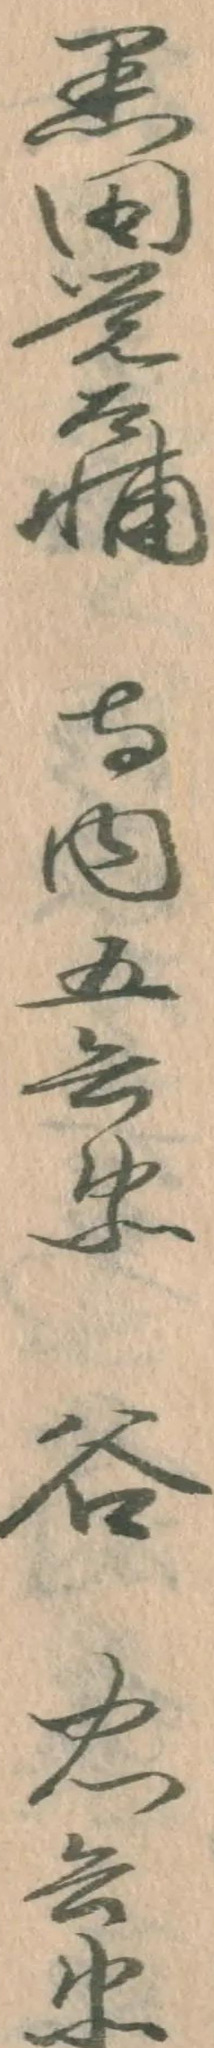黒田覚太輔寺内五兵衛谷忠兵衛
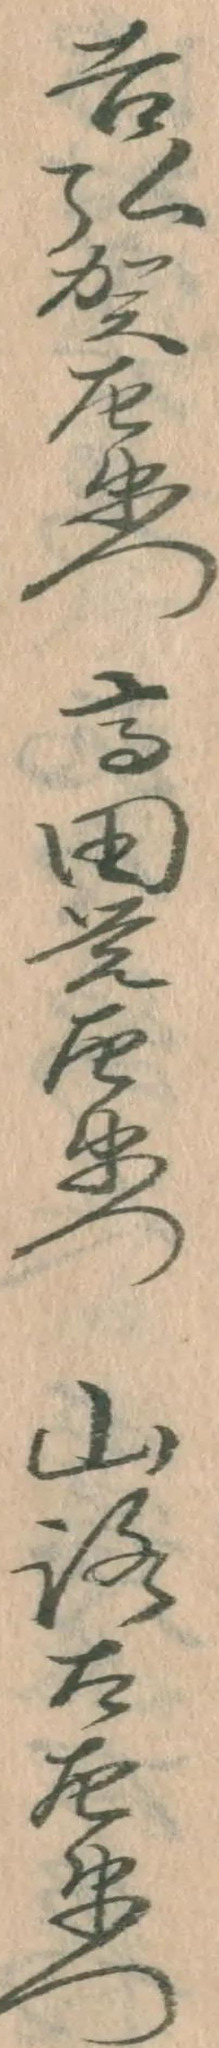吉弘賀左衛門高田覚左衛門山路太左衛門
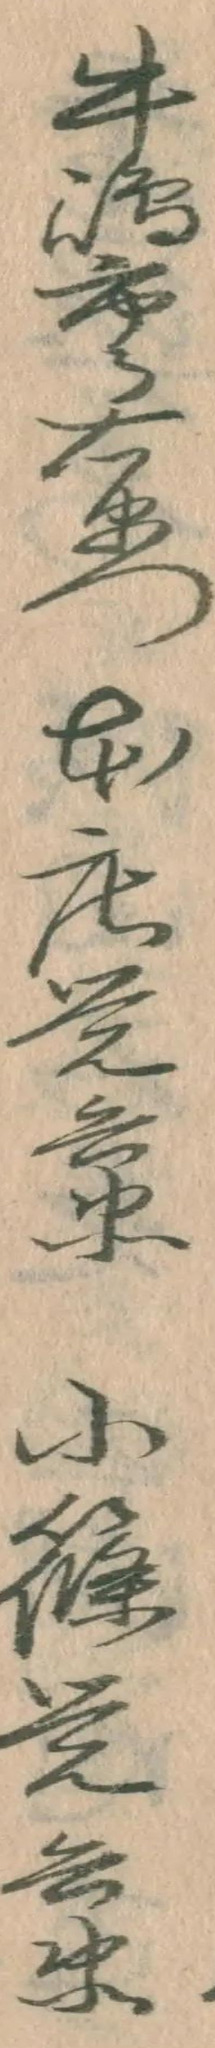牛島市郎右衛門本庄覚兵衛小篠覚兵衛
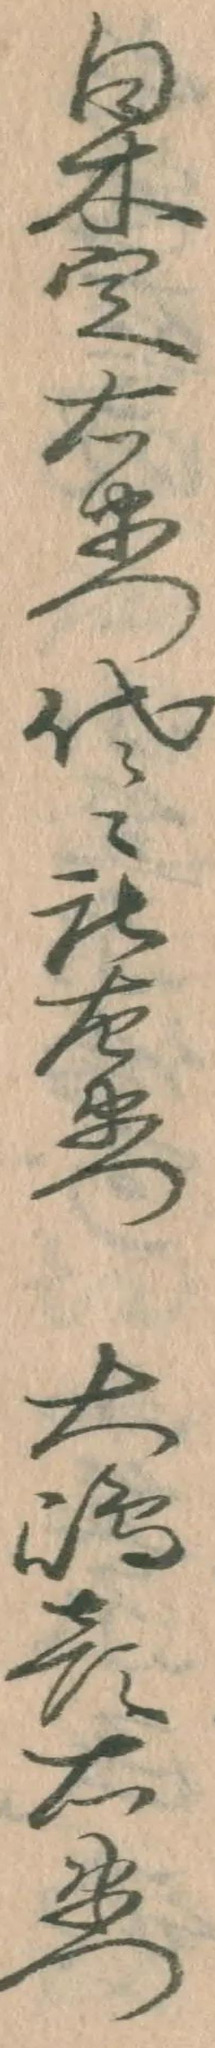白木定右衛門佐々庄左衛門大島彦右衛門
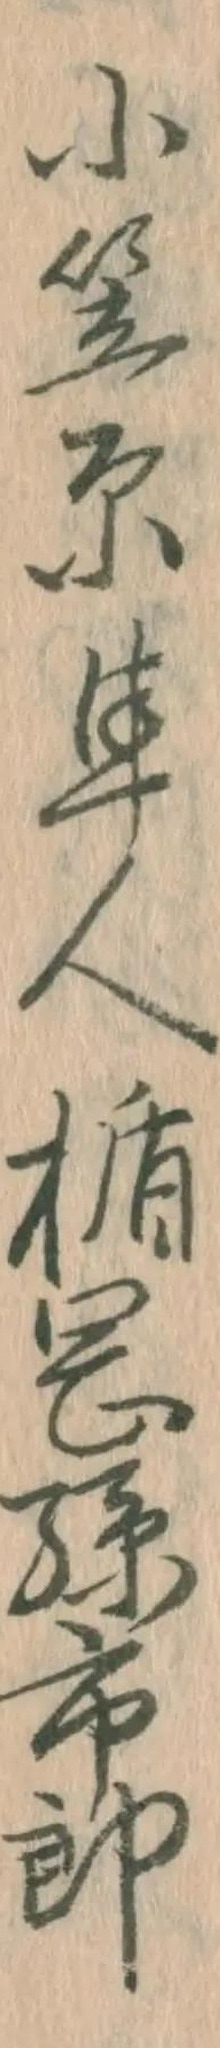小笠原隼人楯岡孫市郎
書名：切支丹御退治記 49巻. [9]
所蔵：国立国会図書館 National Diet Library, JAPAN
